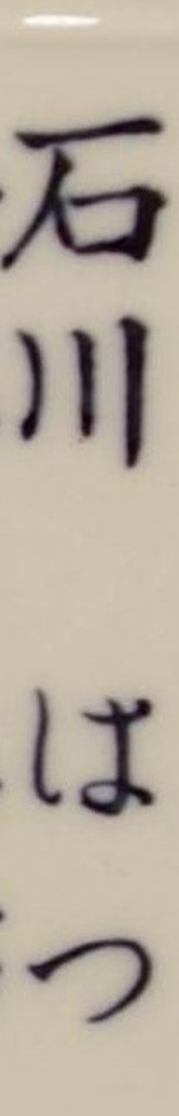石川はつ
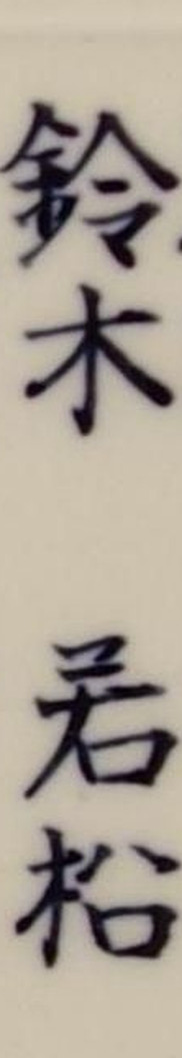鈴木若松
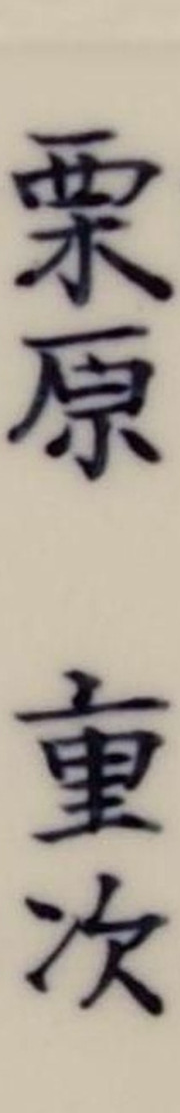栗原重次
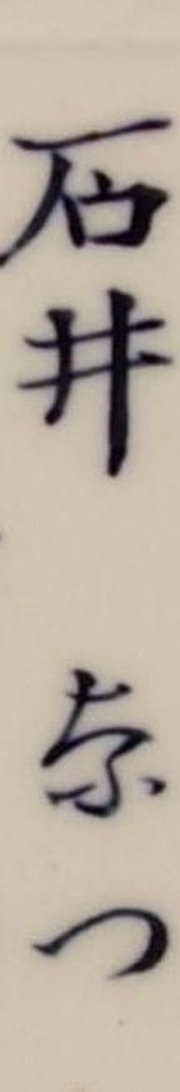石井なつ
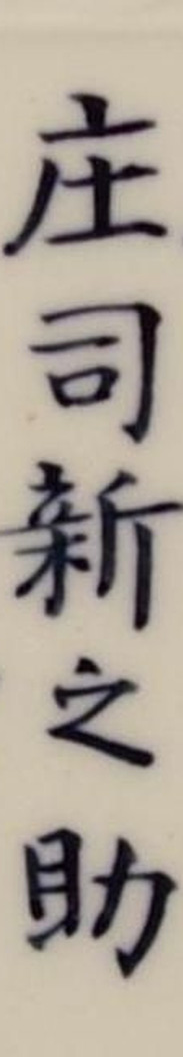庄司新之助
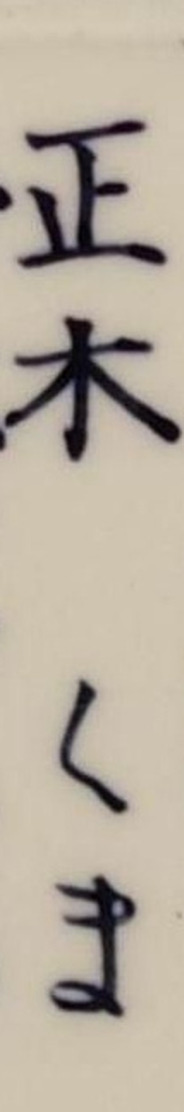正木くま
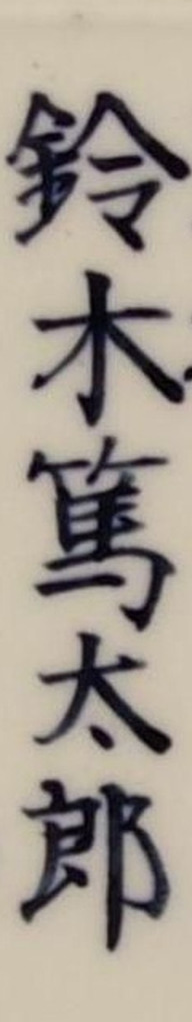鈴木篤太郎
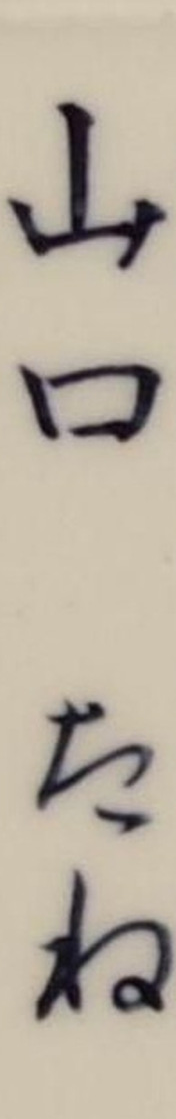山口たね
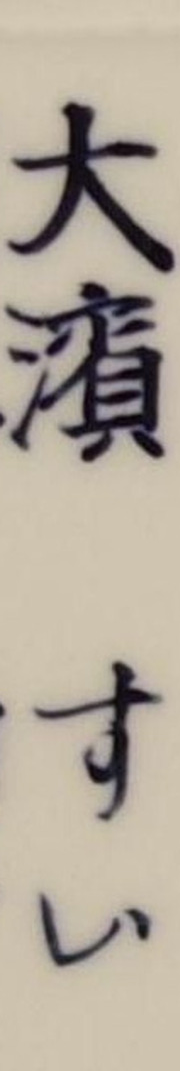大浜すい
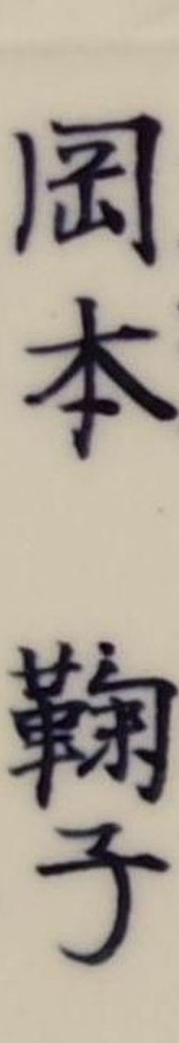岡本鞠子
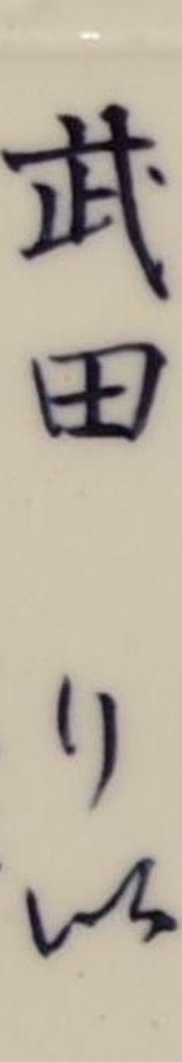武田りい
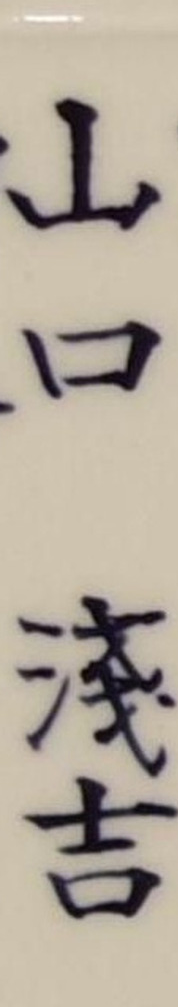山口浅吉
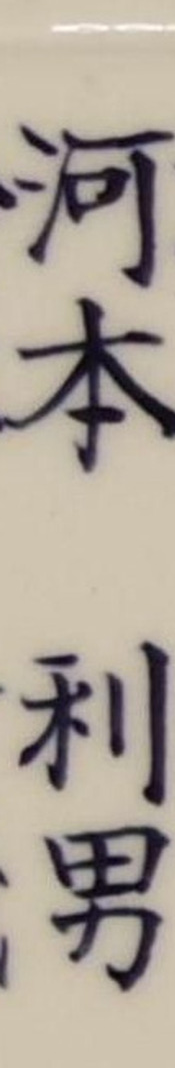河本利男

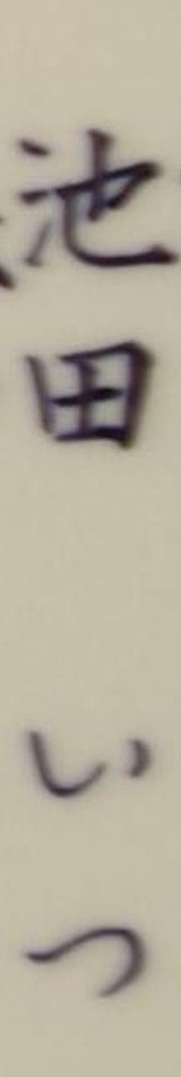池田いつ
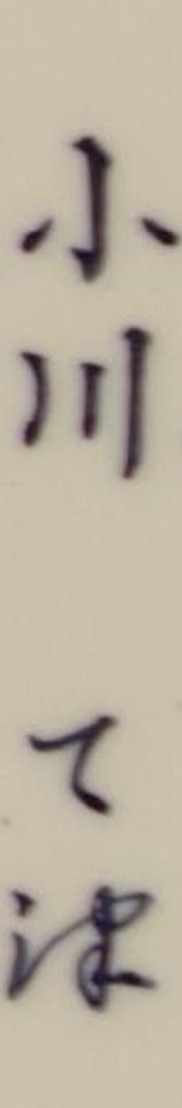小川てつ
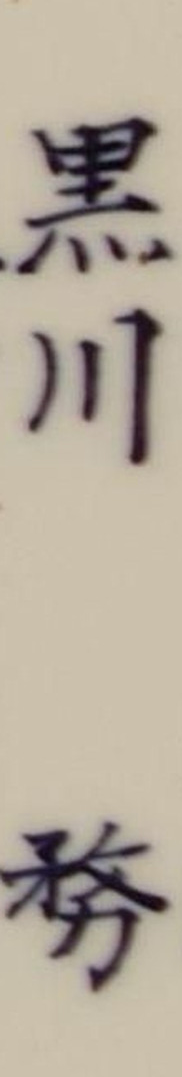黒川務
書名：E~L
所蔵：高野山金剛峯寺
